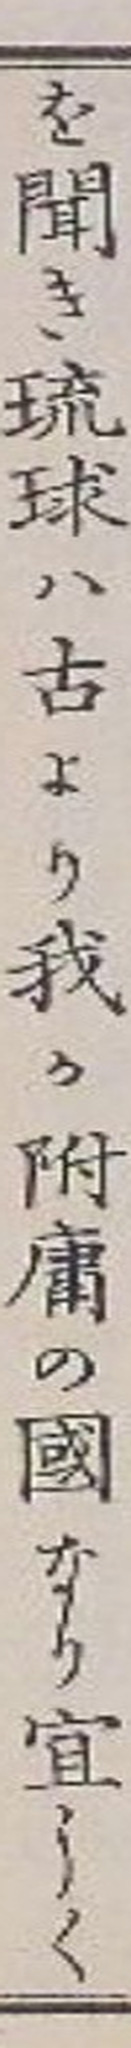を聞き琉球は古より我か付庸の国なり宜しく
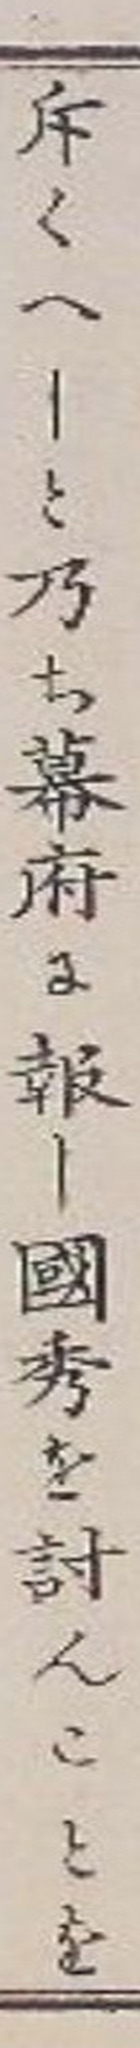斥くへしと乃ち幕府に報し国秀を討んことを
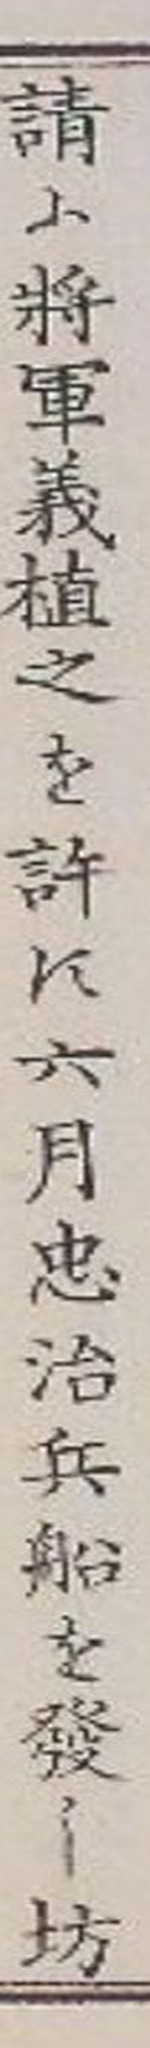請ふ将軍義植之を許す九月忠治兵船を発し坊
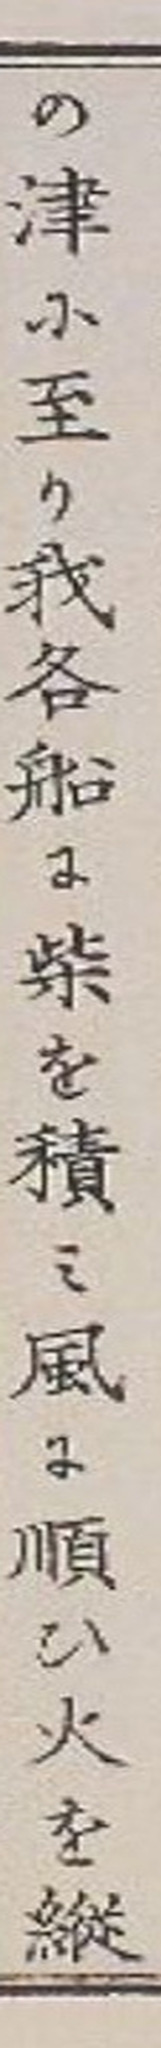の津に至り我各船に柴を積み風に順ひ火を縦
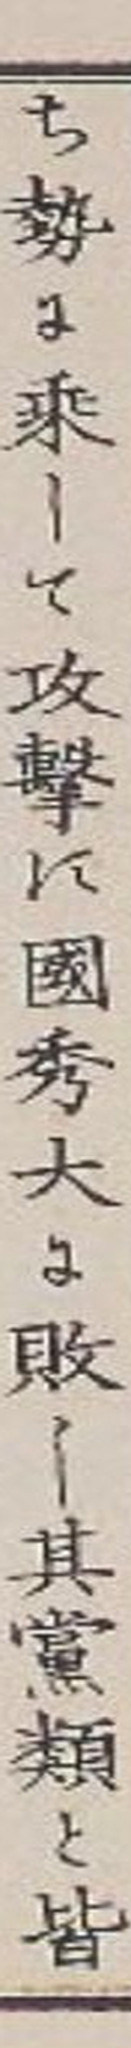ち勢に乗して攻撃す国秀大に敗し其党類と皆
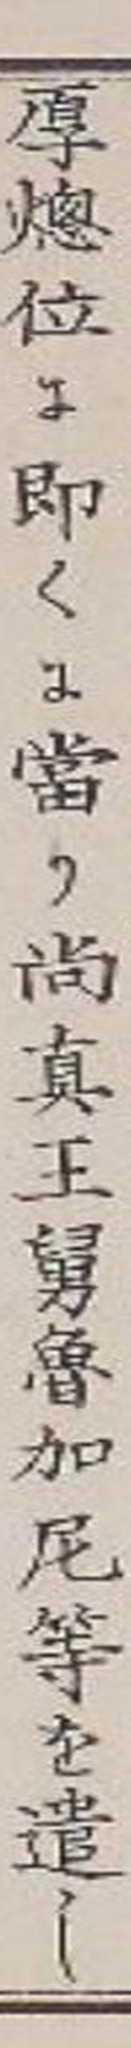厚熜位に即くに当り尚真王舅魯加尼等を遣し
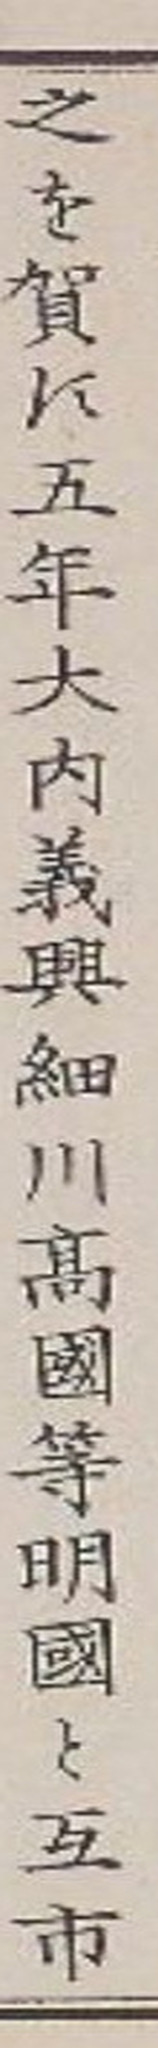之を賀す五年大内義興細川高国等明国と互市
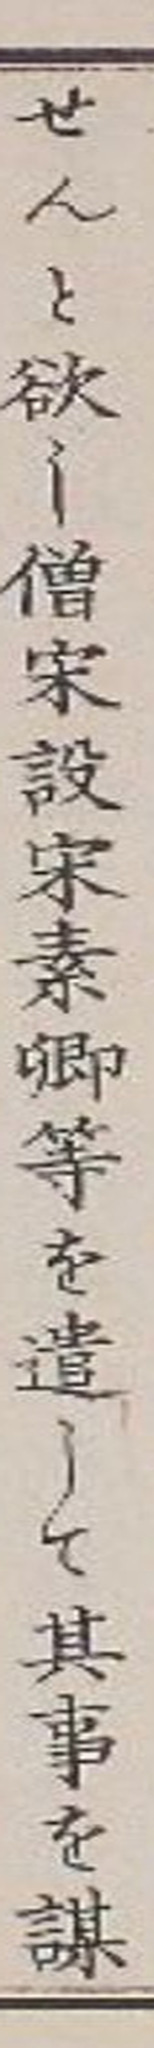せんと欲し僧宗設宗素卿等を遣して其事を謀
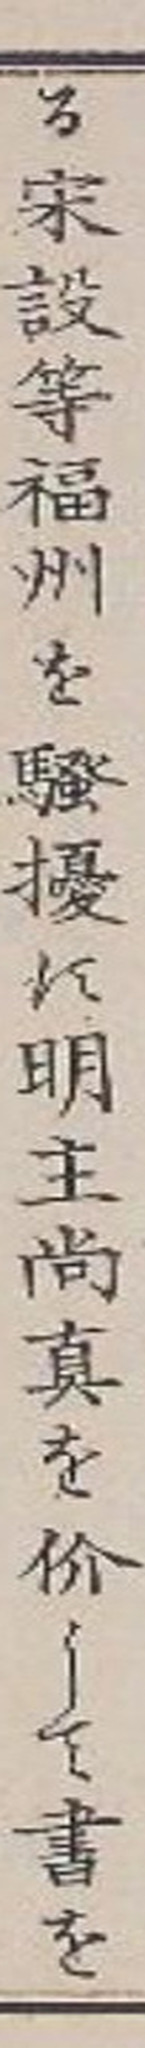る宗設等福州を騒擾す明主尚真を价して書を
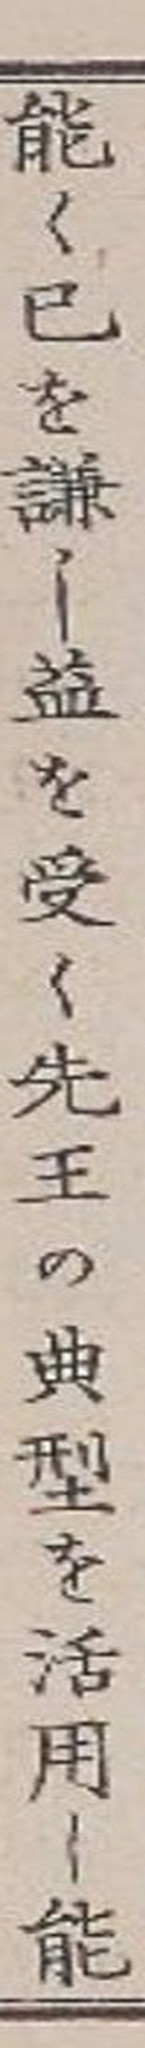能く己を謙し益を受く先王の典型を活用し能

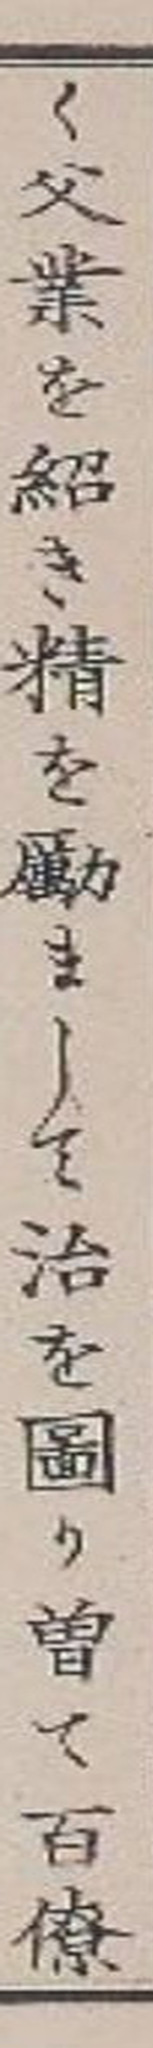く父業を紹き精を励まして治を図り曽て百僚
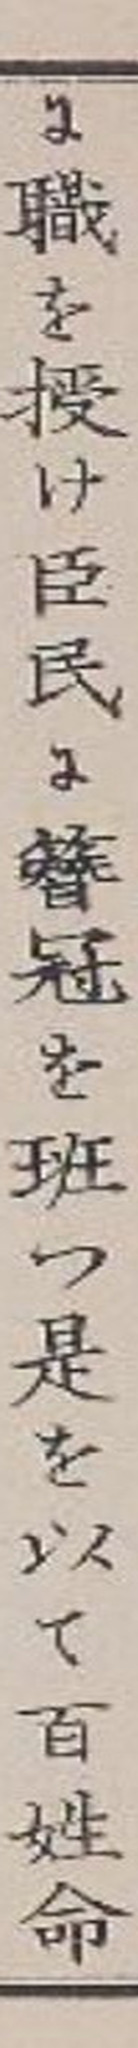に職を授け臣民に簪冠を班つ是を以て百姓命
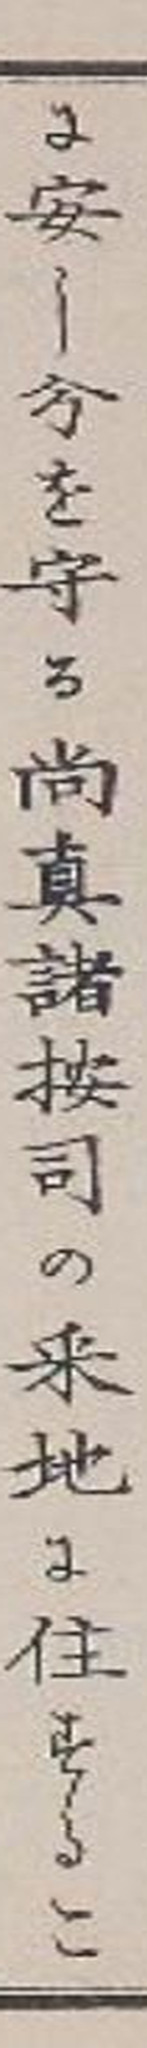に安し分を守る尚真諸按司の采地に住するこ
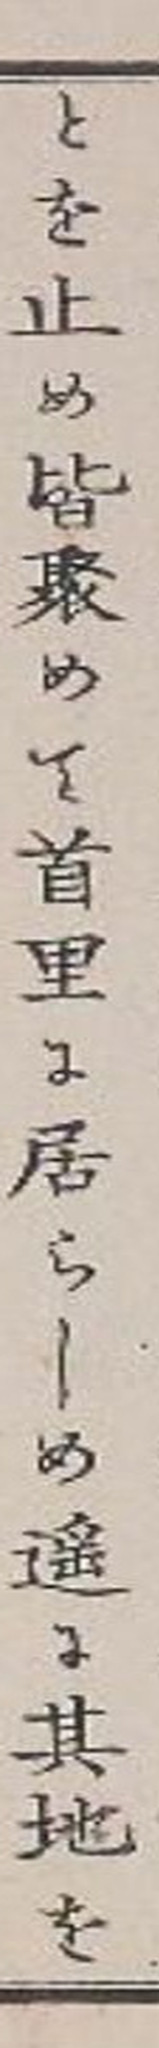とを止め皆聚めて首里に居らしめ遥に其地を
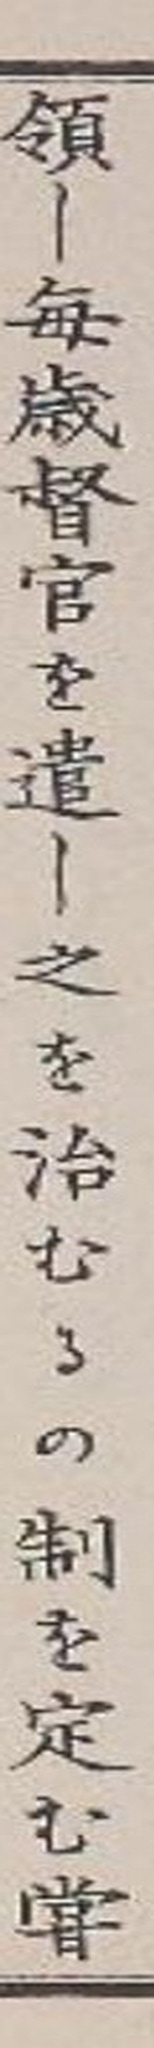領し毎歳督官を遣し之を治むるの制を定む嘗
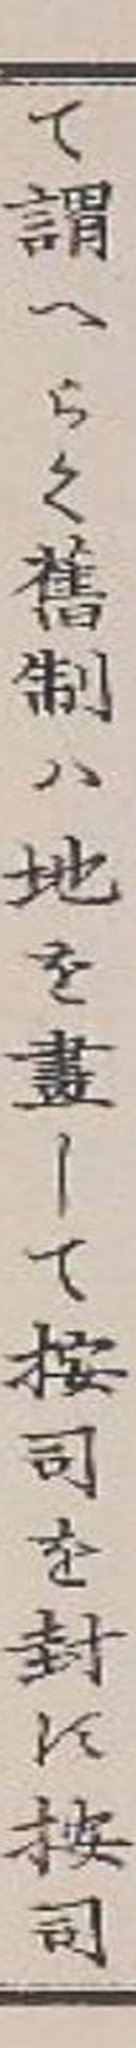て謂へらく旧制は地を画して按司を封す按司
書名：南島紀事 中
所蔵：University of the Ryukyus Library
